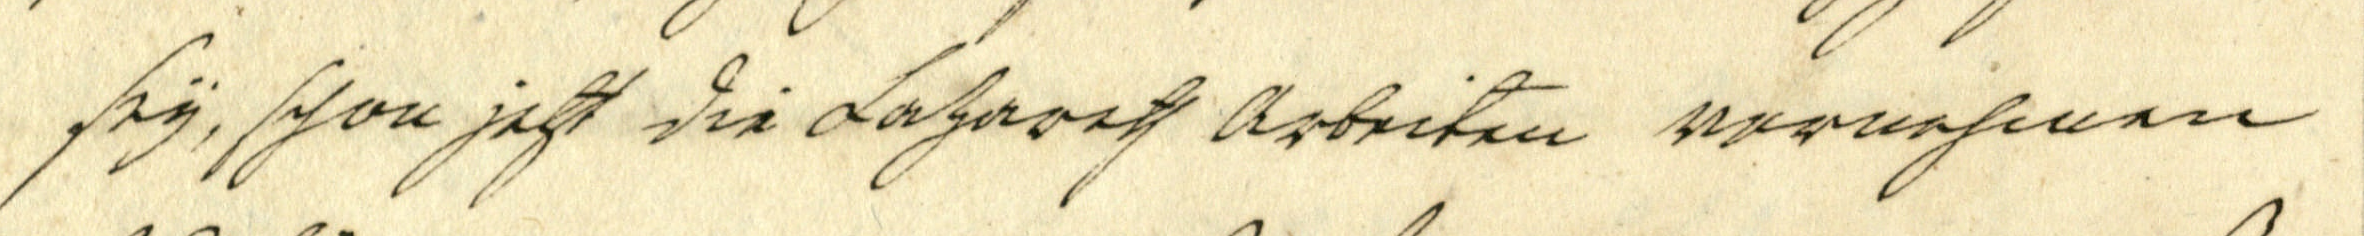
seÿ, schon jetzt die Lazareth Arbeiten vornehmen
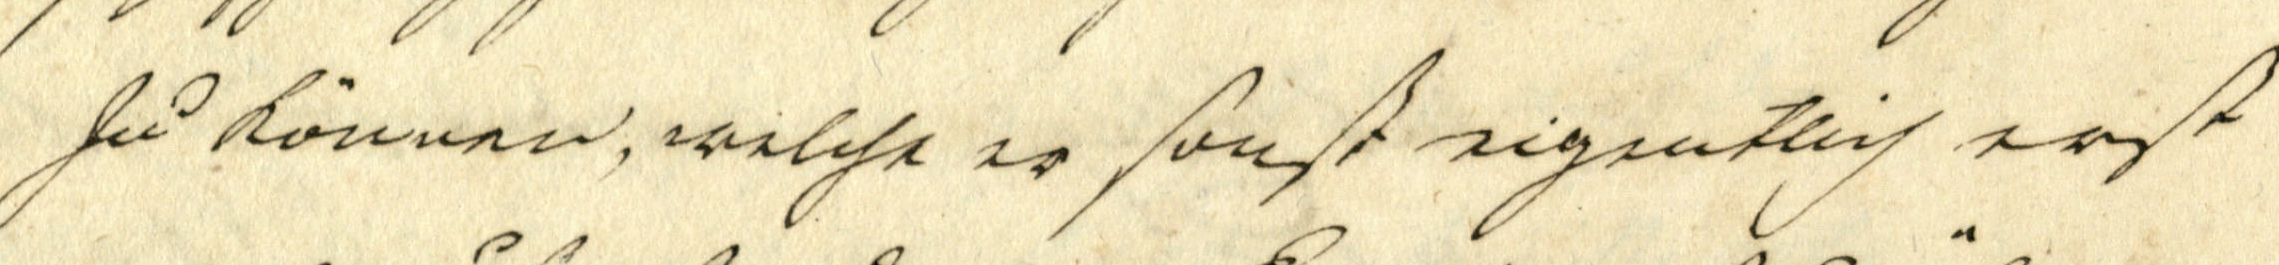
zu können, welche er sonst eigentlich erst
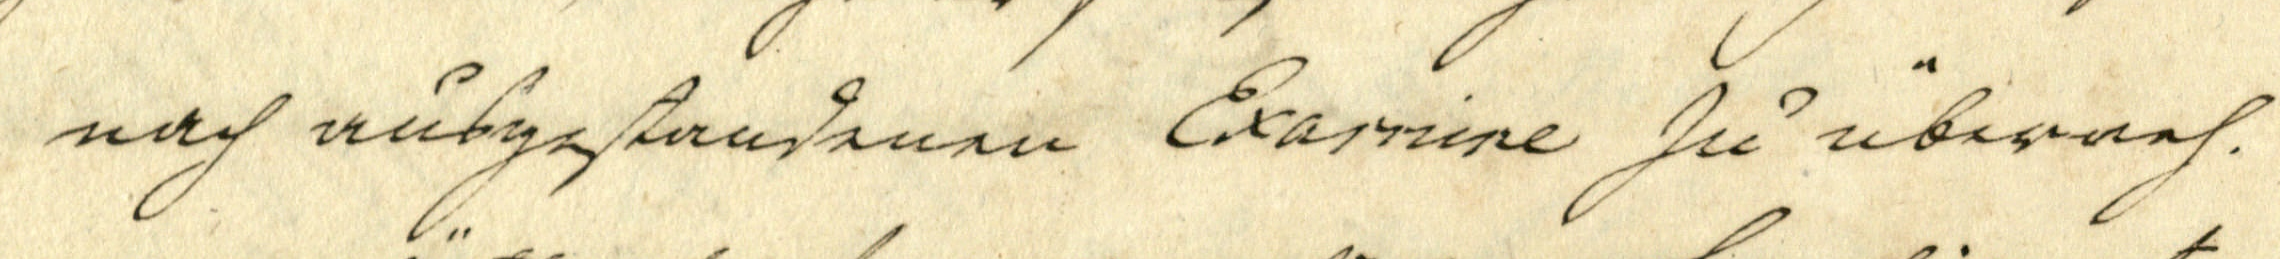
nach ausgestandenen Examine zu überneh¬
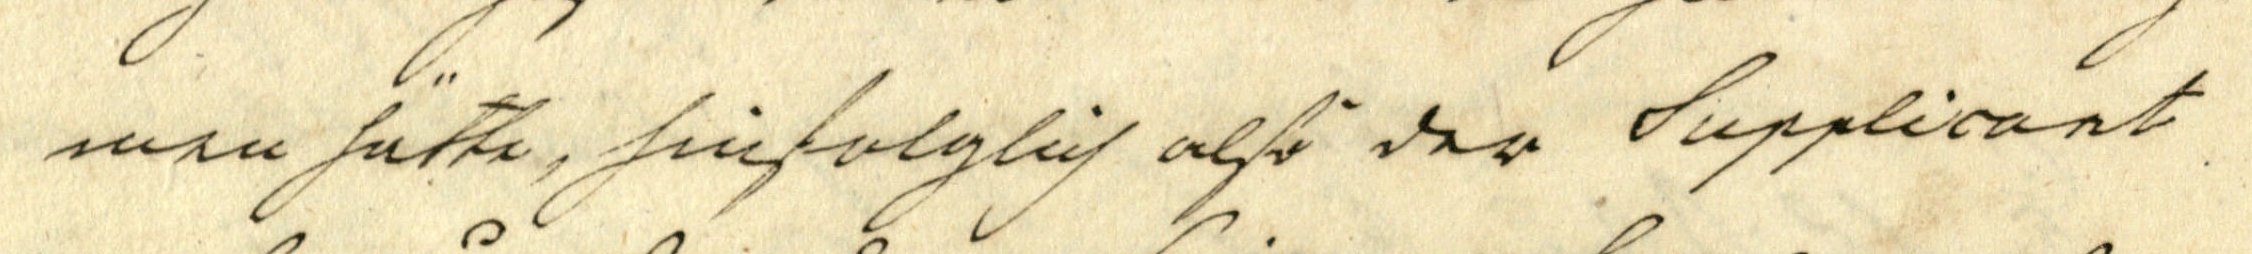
men hätte, hinfolglich also der Supplicant
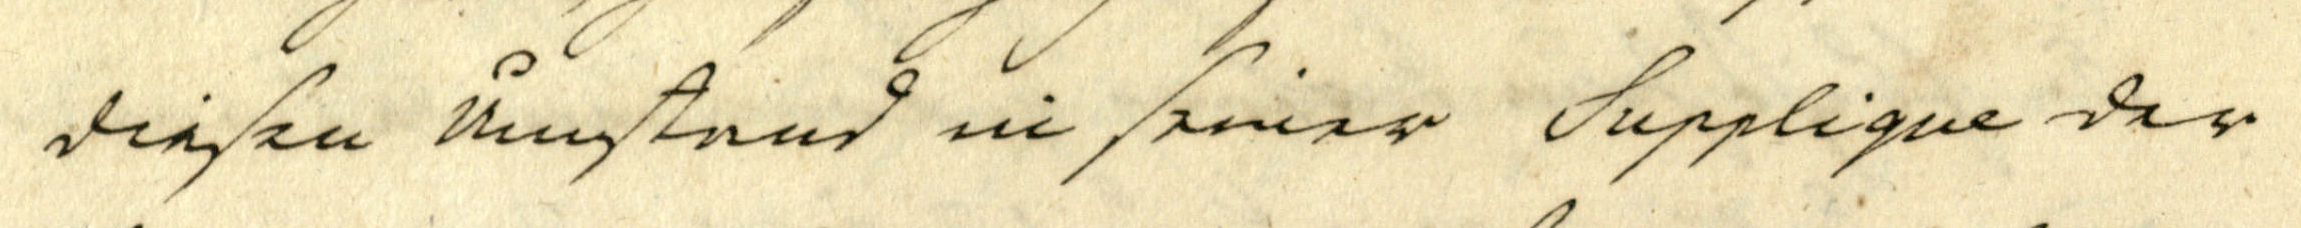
diesen Umstand in seiner Supplique der
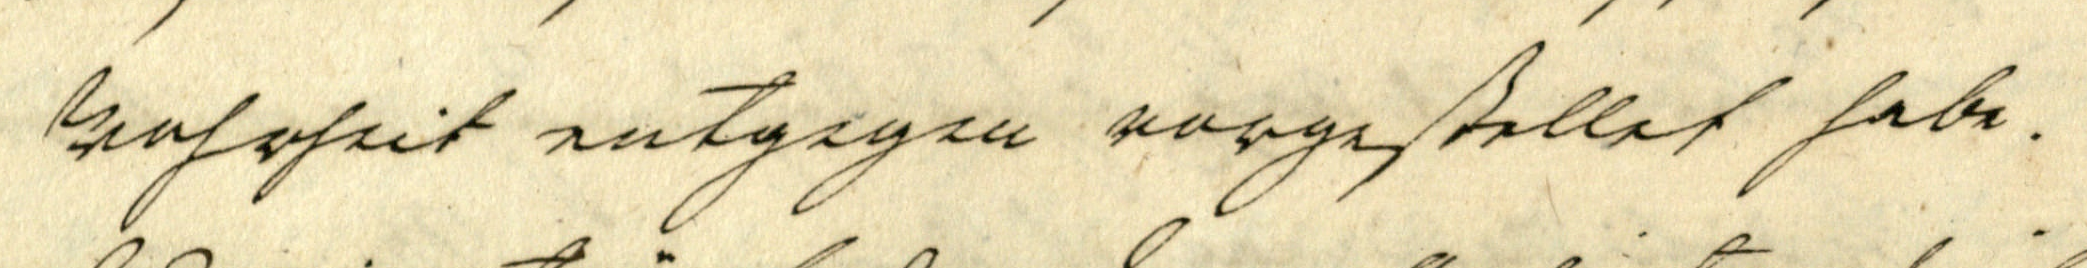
Wahrheit entgegen vorgestellet habe.
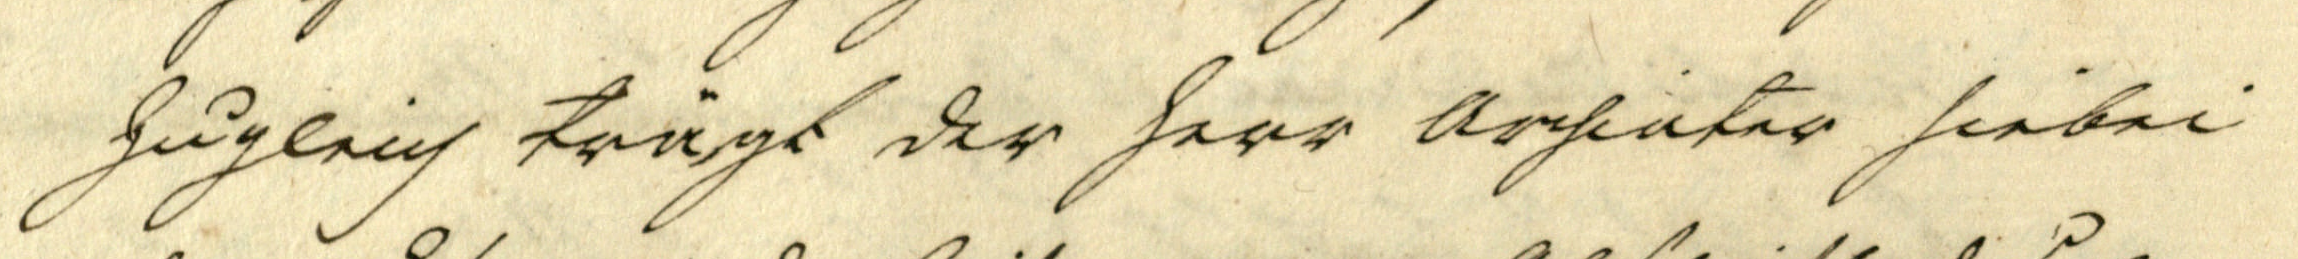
Zugleich trägt der Herr Archiater hiebei
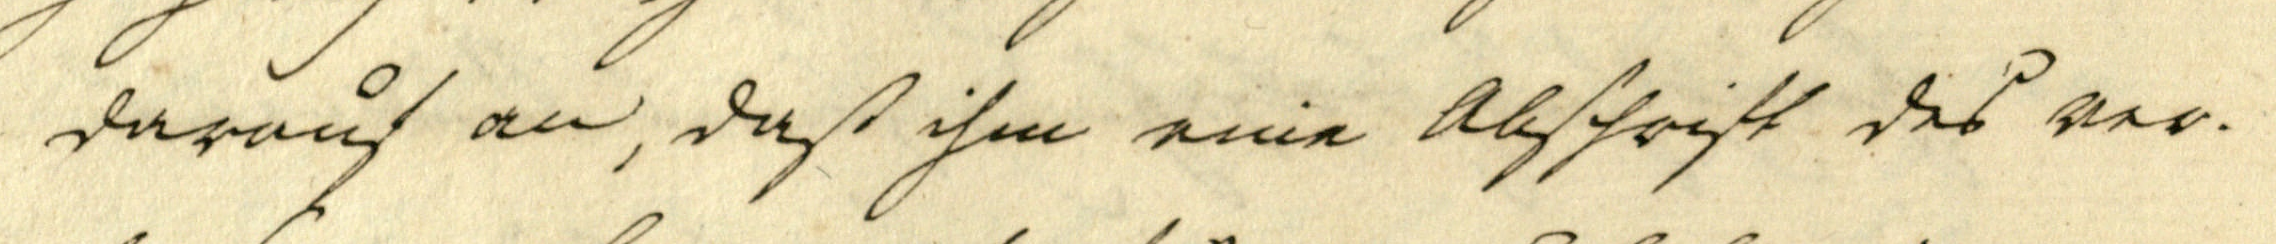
darauf an, daß ihm eine Abschrift des ver¬
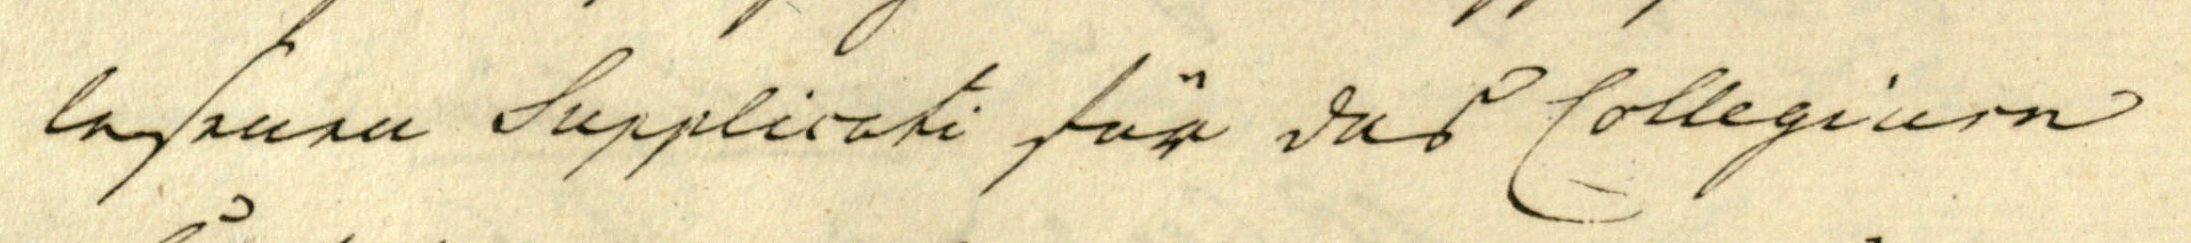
lesenen Supplicati für das Collegium
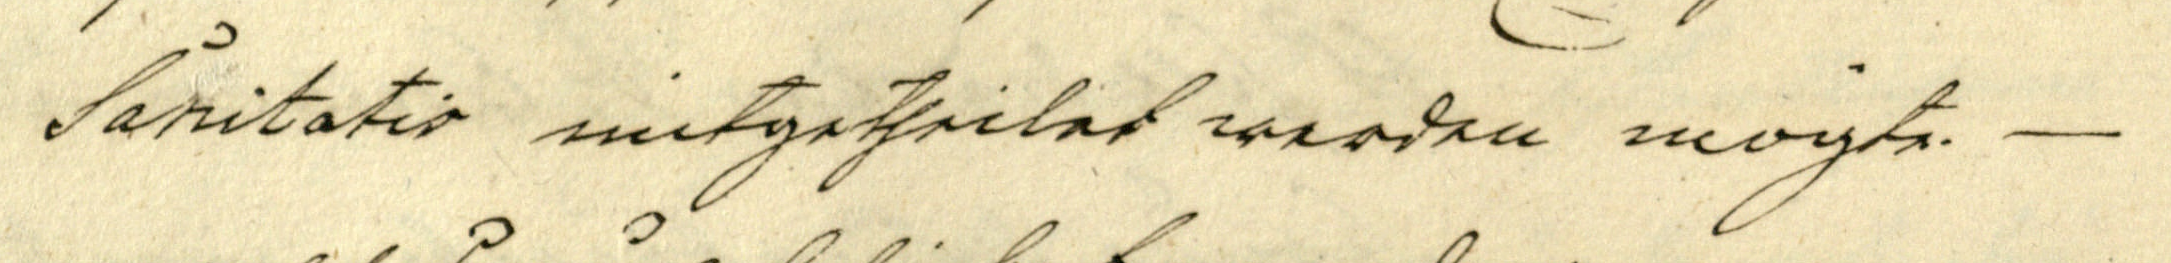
Sanitatis mitgetheilet werden mögte.
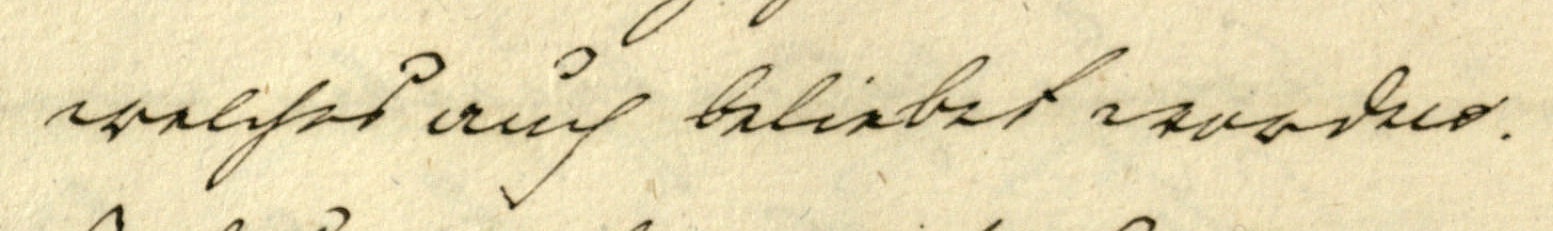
welches auch beliebet worden.
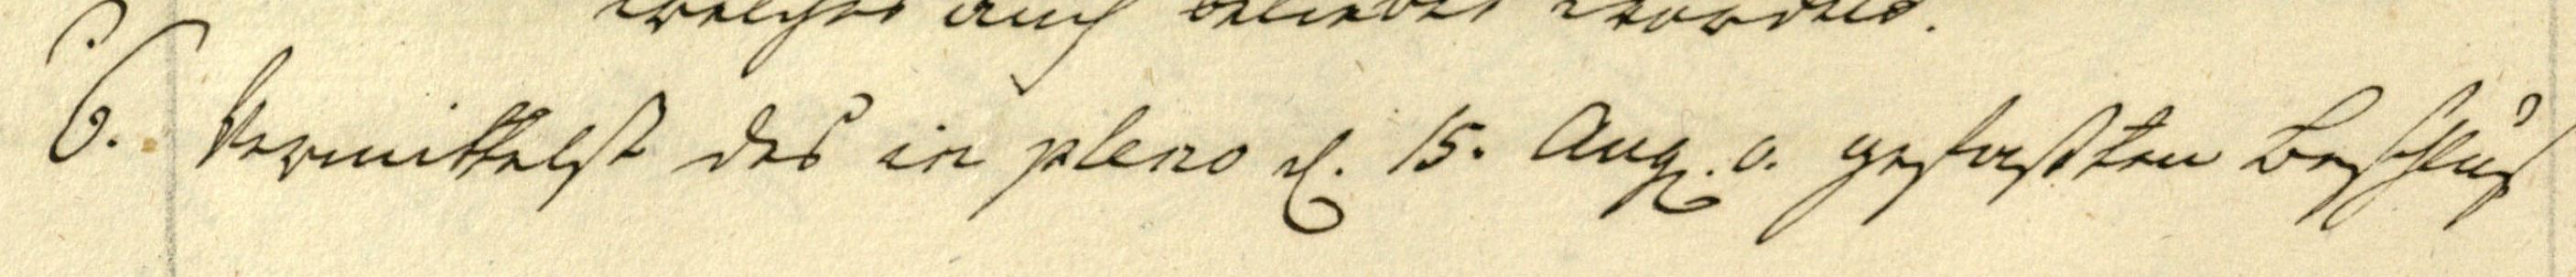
6. Vermittelst des in pleno d. 15. Aug. c. gefaßten Beschlus
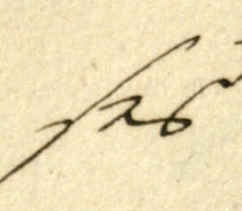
ses
